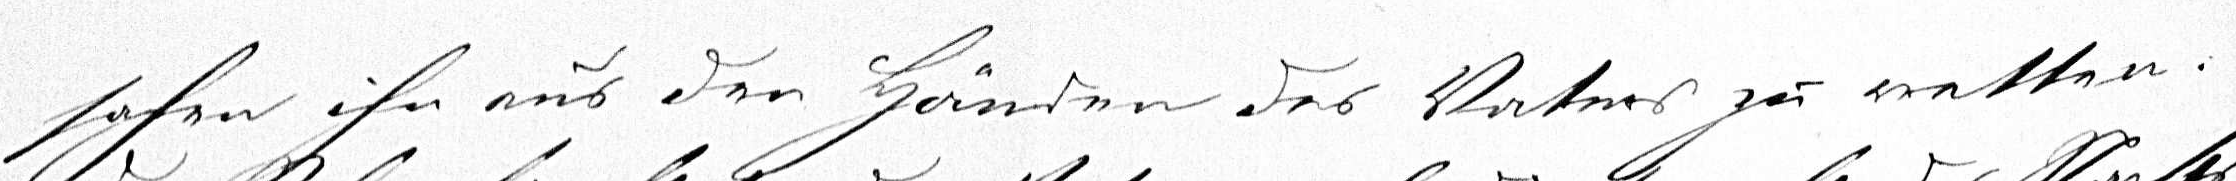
sahen ihn aus den Händen des Vaters zu retten.
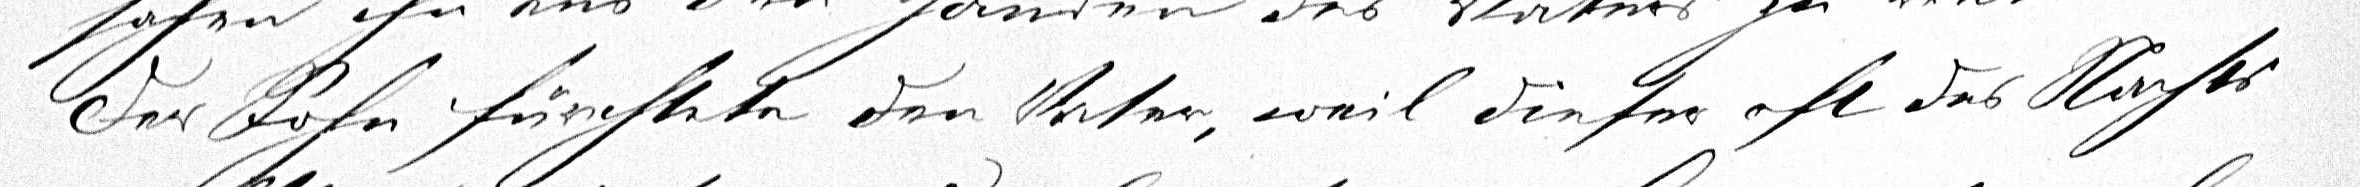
Der Sohn fürchtete den Vater, weil dieser oft des Nachts
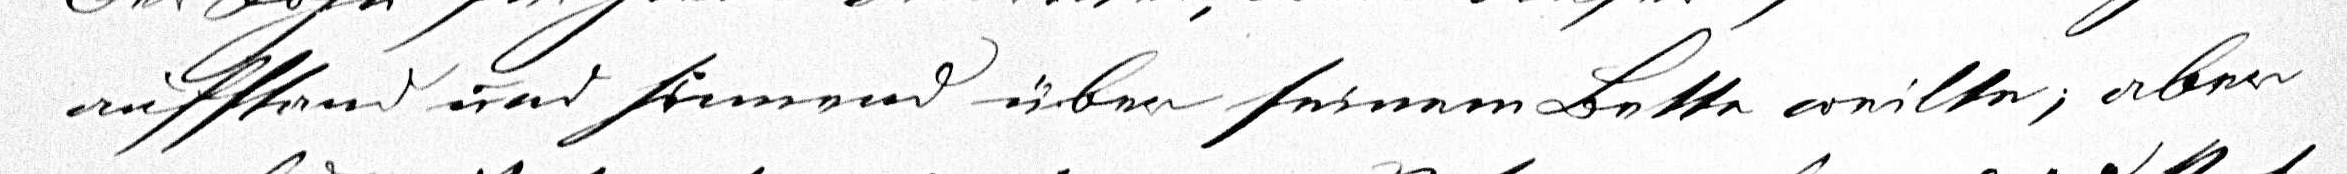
aufstand und xx über seinem Bette weilte; aber
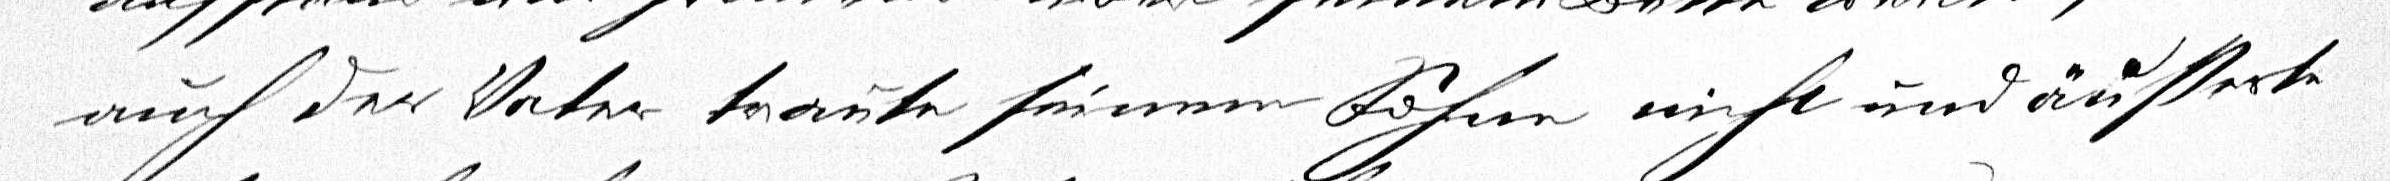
auch der Vater traute seinem Sohne nicht und äußerte
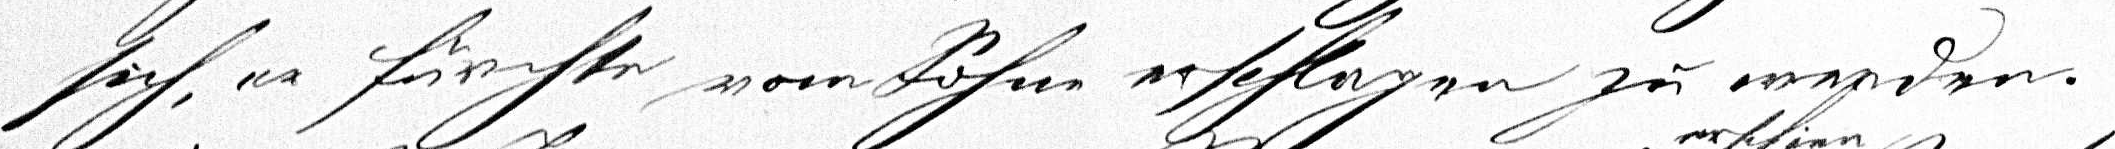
sich, er Furchte vom Sohne erschlagen zu werden.
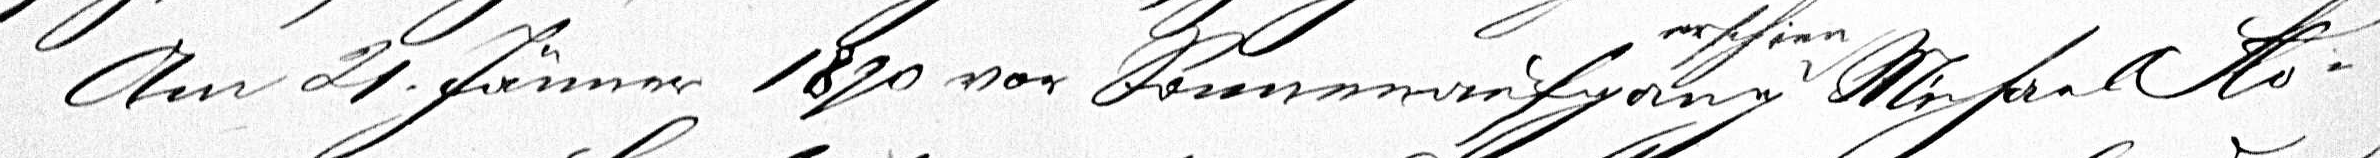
Am 21. Jänner 1890 vor Sonnenaufgang erschien Michael Ho¬
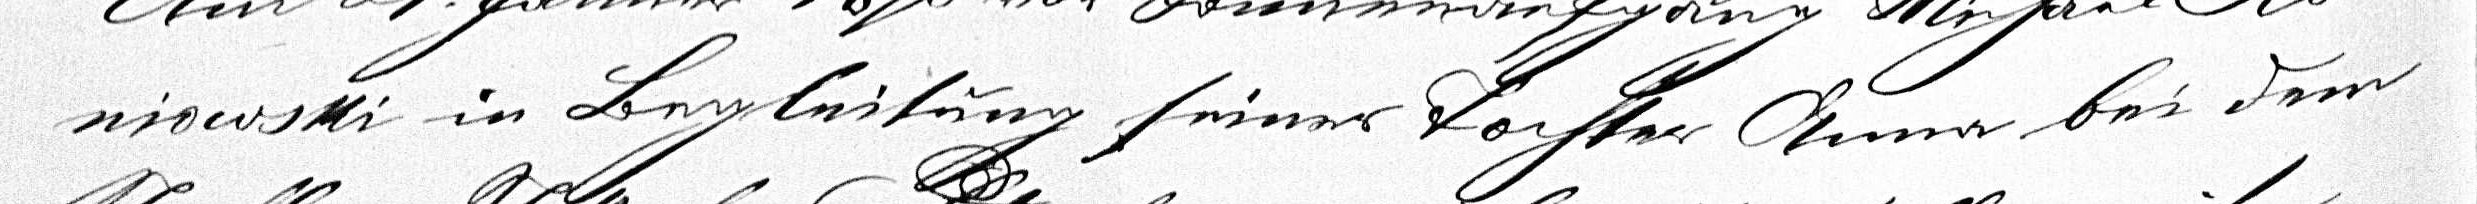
niowski in Begleitung seines Tochter Anna bei dem
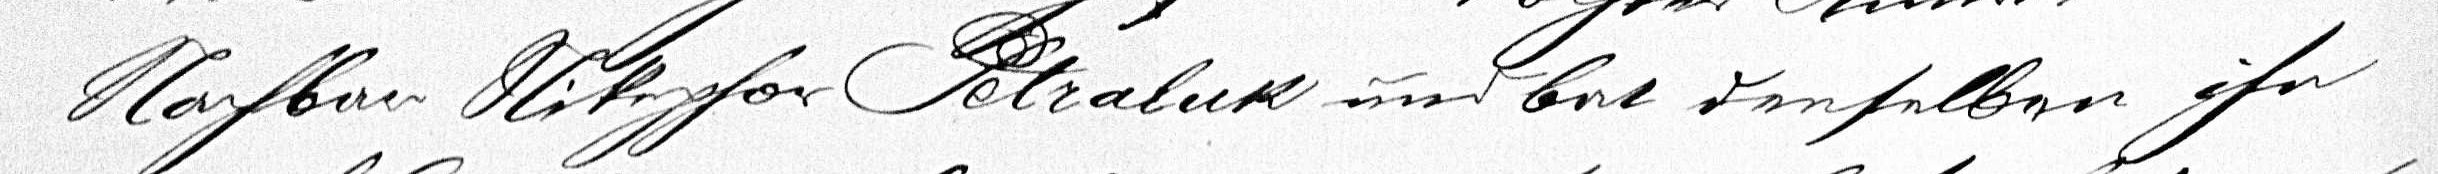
Nachbar Nikephor Petraluk und bat denselben ihn
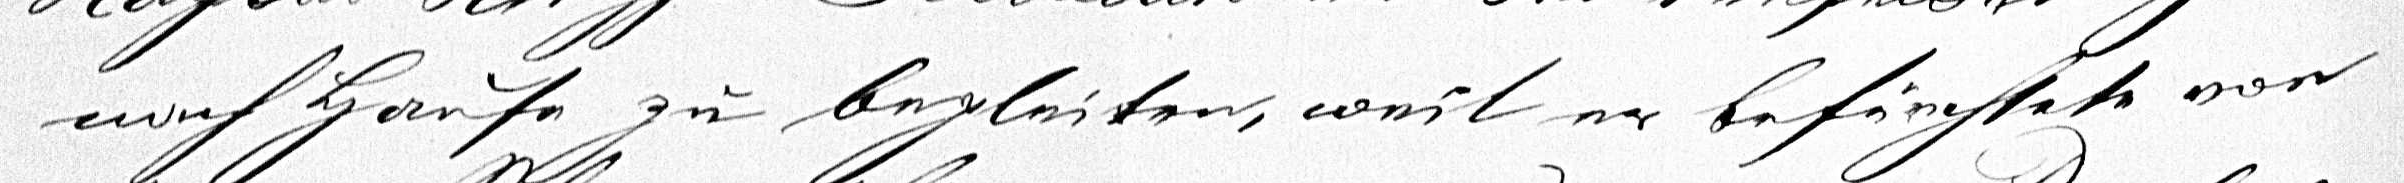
nach Hause zu begleiten, weil er befürchtete von
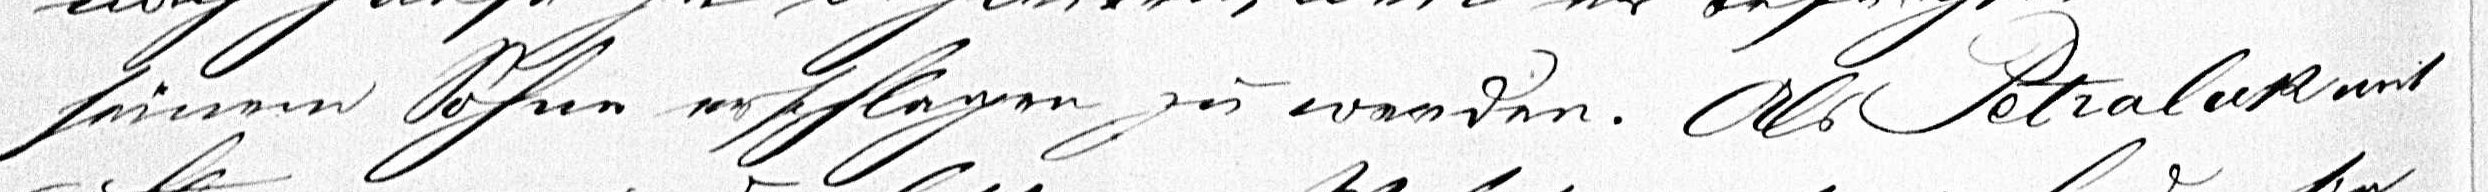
seinem Sohne erschlagen zu werden. Als Petraluk mit
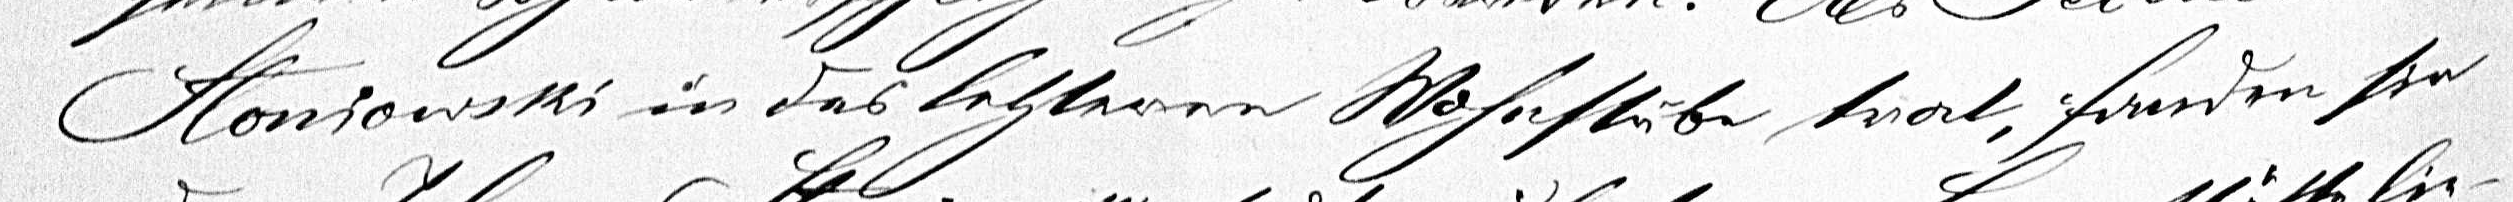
Stoniowski in des letzteren Wohnstube trat, fanden sie
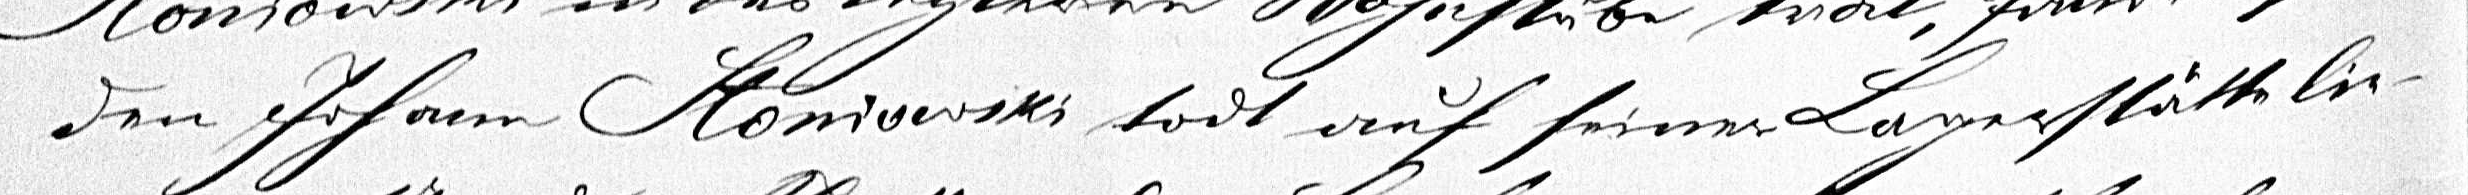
den Johann Stoniowski todt auf seiner Lagerstätte lie¬
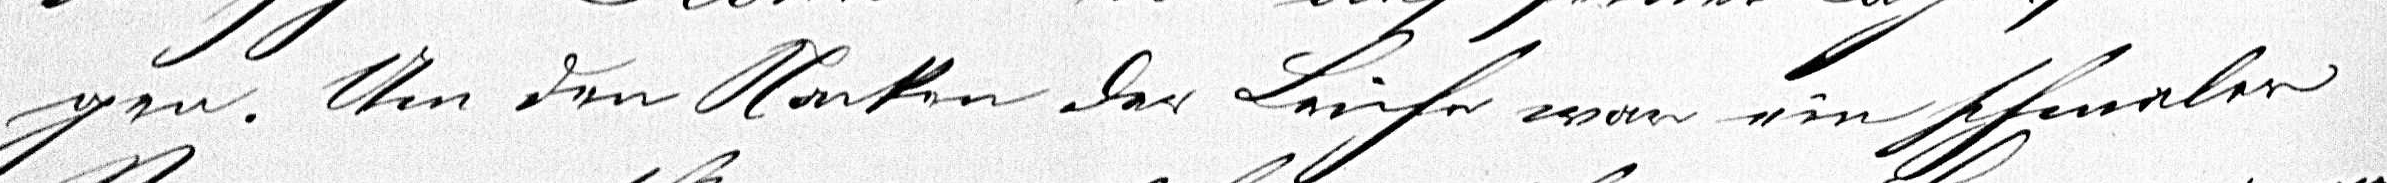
gen. Um den Nacken der Leiche war ein schmalen
